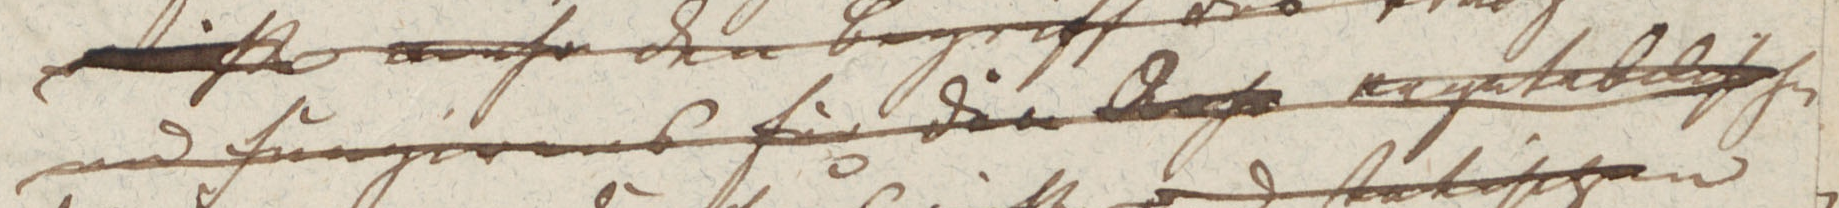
und Fungirens für die Rohe vegetabilische
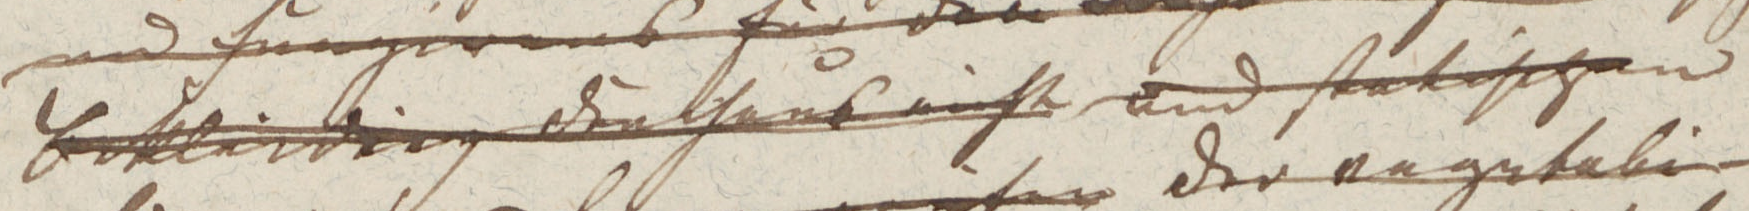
Bekleidung durchaus nicht und statischen
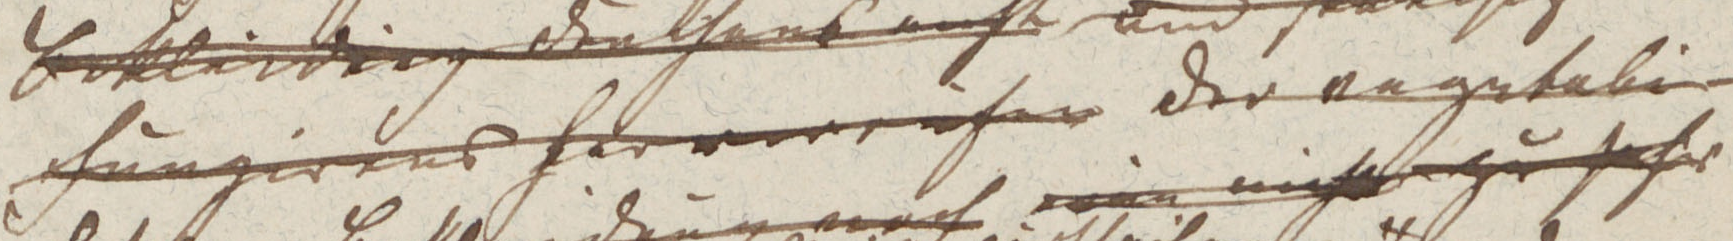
Fungirens hervorriefen der vegetabi-
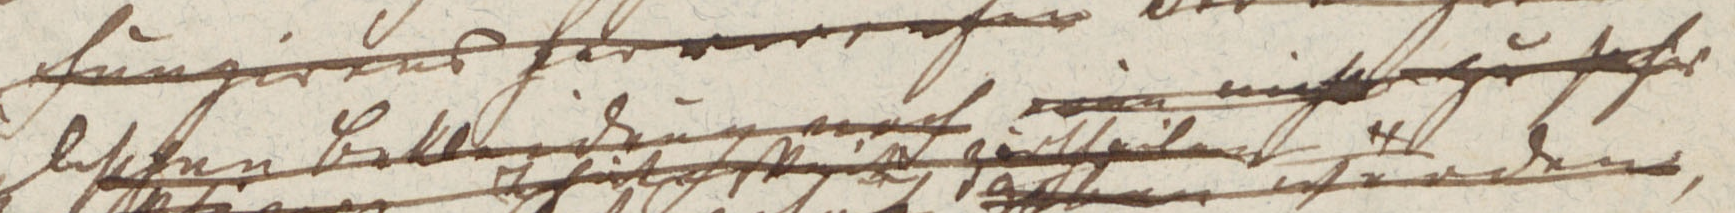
lischen Bekleidung nach eine nicht zu sehr
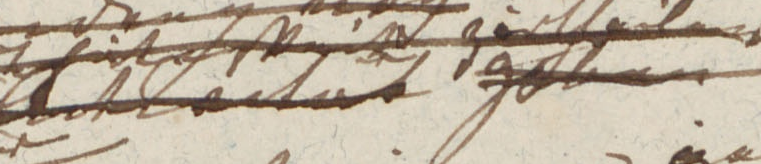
struktiver Thätigkeit zertheilen
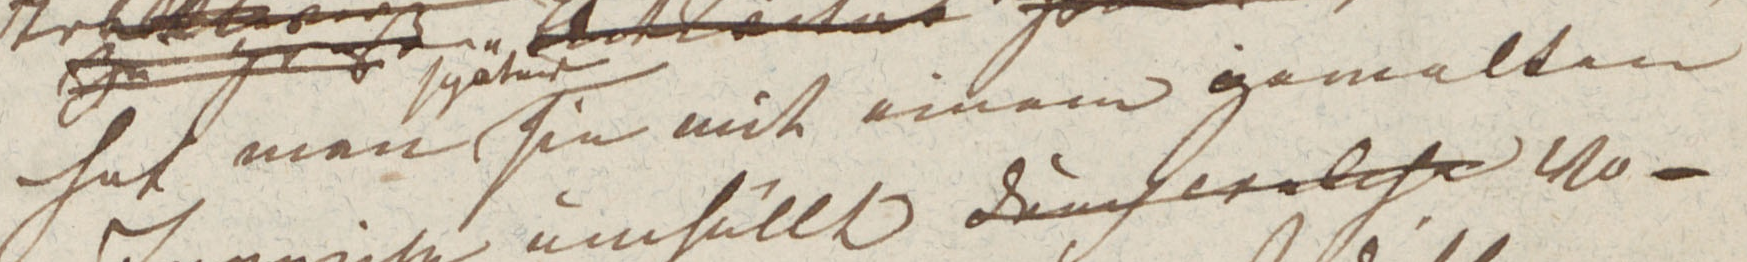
hat man später sie mit einem igemalten
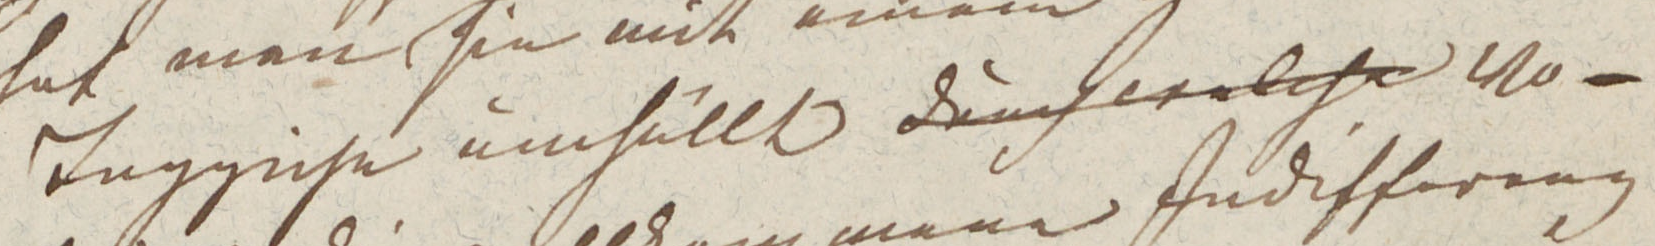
Teppiche umhüllt durch welche wo-
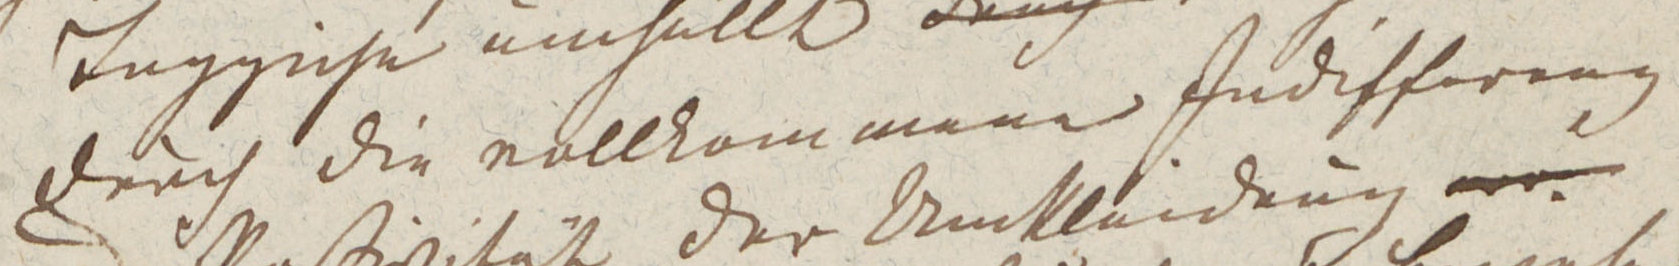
durch die vollkommene Indifferenz
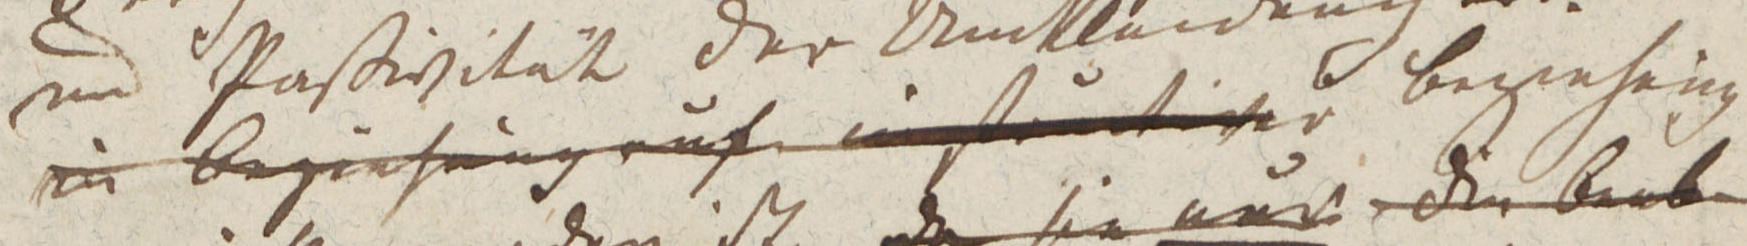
in Beziehung auf in structiver Beziehung
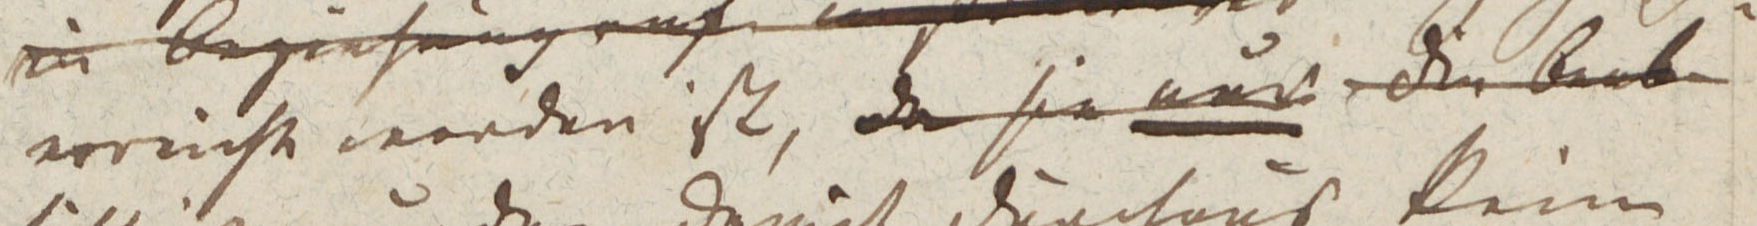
erreicht worden ist, da sie nur die beab-
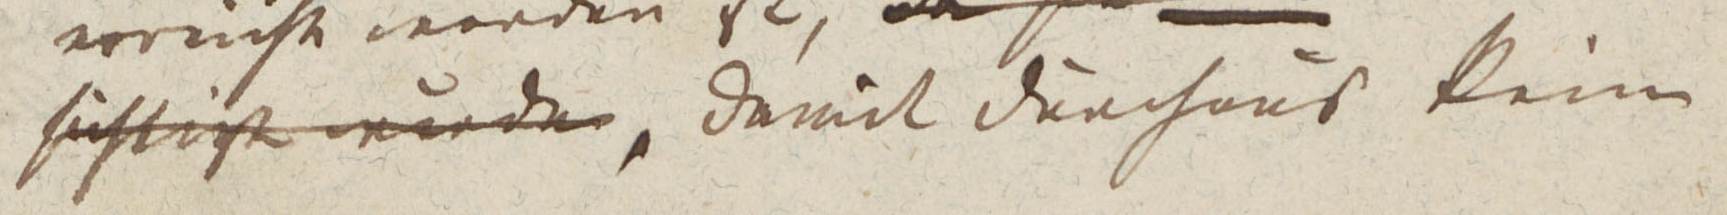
sichtigt wurde, damit durchaus kein
